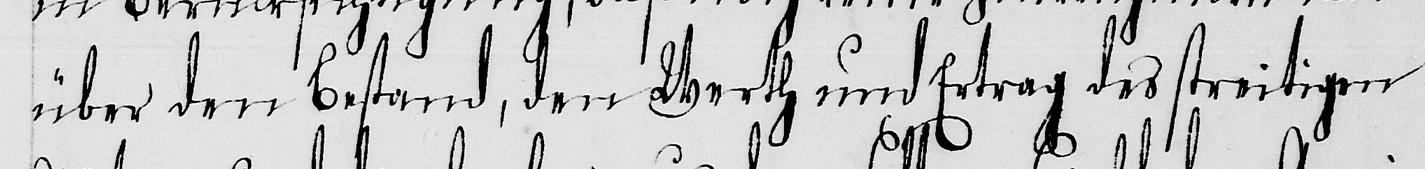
über den Bestand, den Werth und Ertrag des streitigen
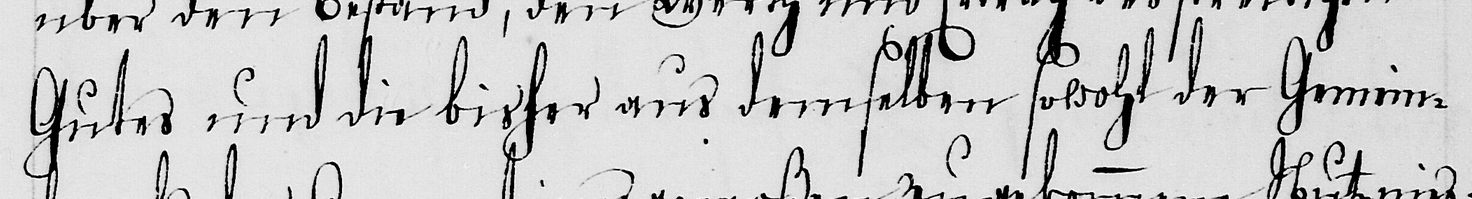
Gutes und die bisher aus demselben sowohl der Gemein¬
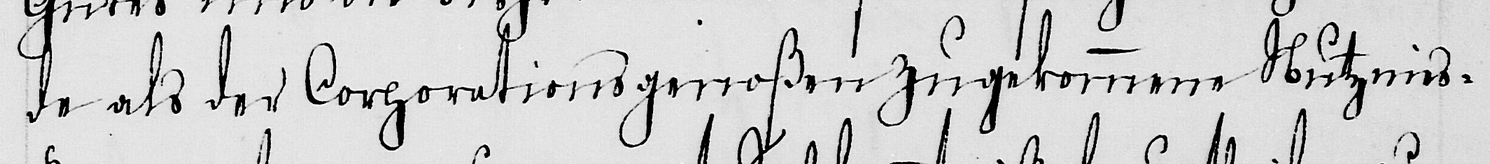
de als der Corporationsgenoßen zugekommene Nutznieß¬
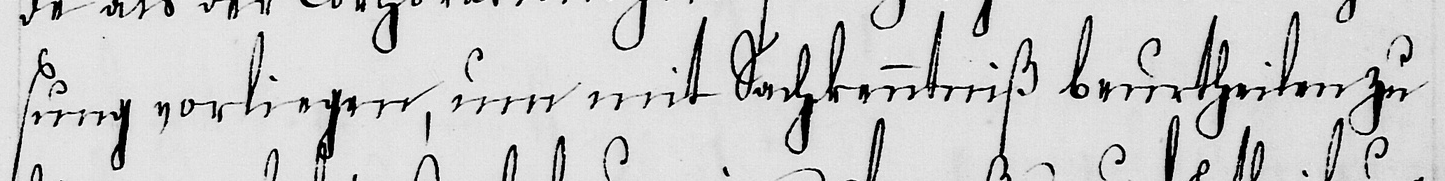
ung vorliegen, um mit Sachkenntniß beurtheilen zu
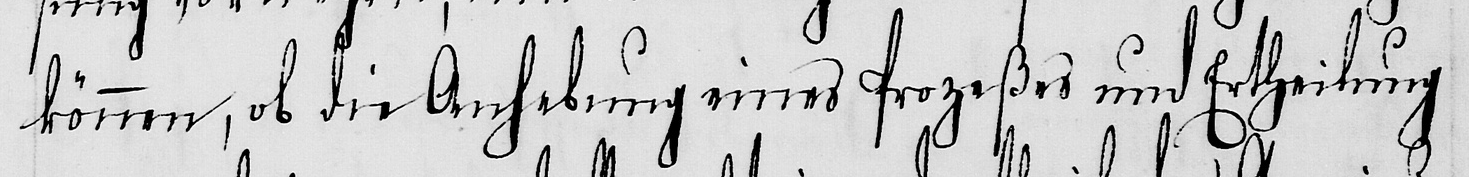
können, ob die Anhebung eines Prozeßes und Ertheilung
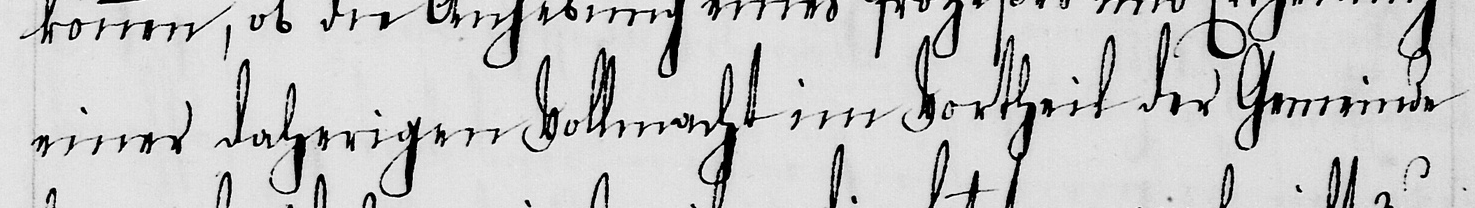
einer daherigen Vollmacht im Vortheil der Gemeinde
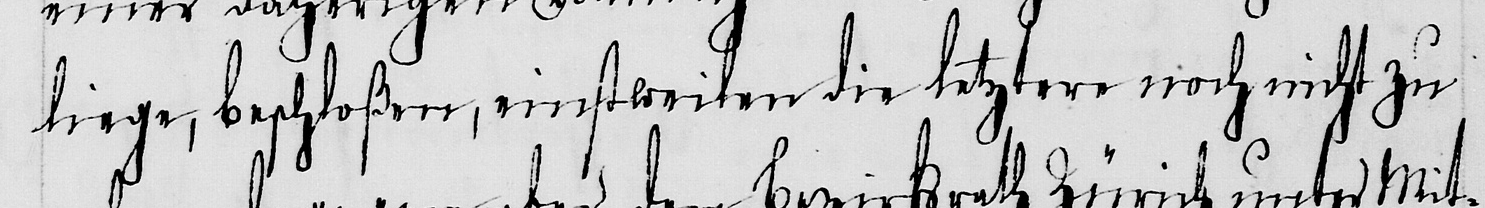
liege, beschloßen, einstweilen die letztere noch nicht zu
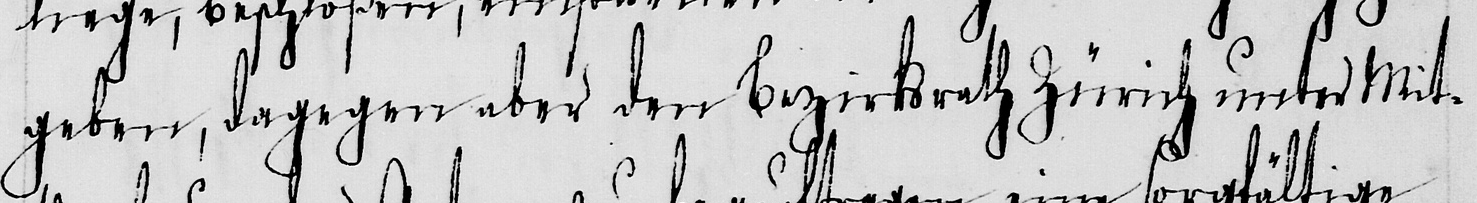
geben, dagegen aber den Bezirksrath Zürich unter Mit¬
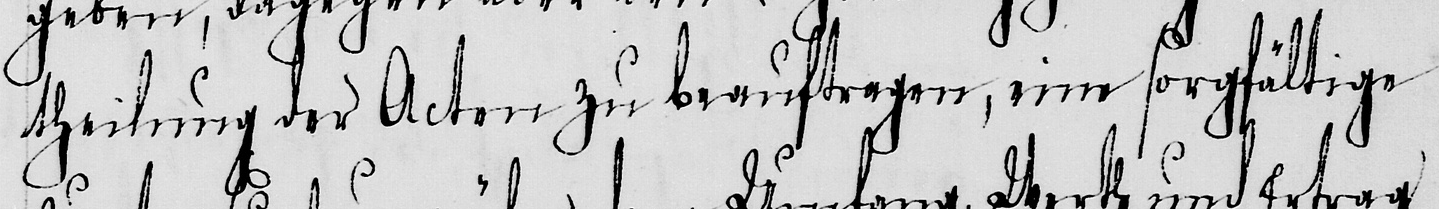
theilung der Acten zu beauftragen, eine sorgfältige
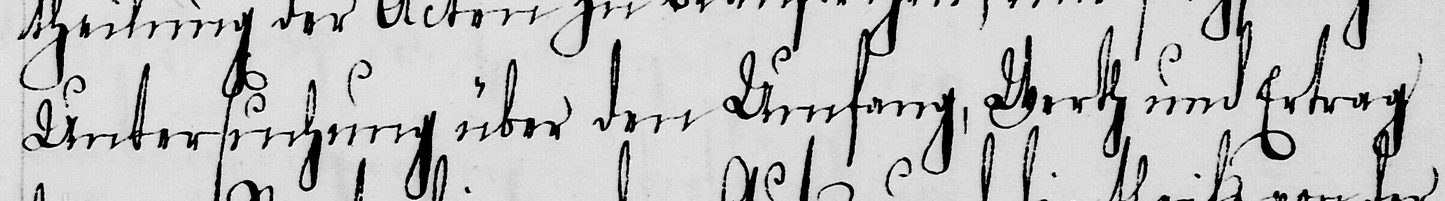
Untersuchung über den Umfang, Werth und Ertrag
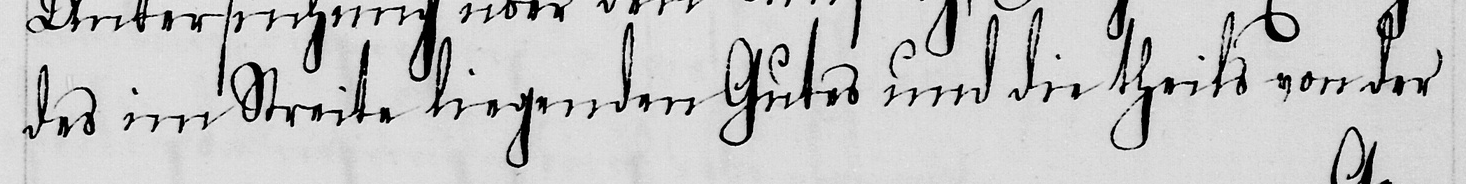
des im Streite liegenden Gutes und die theils von der
